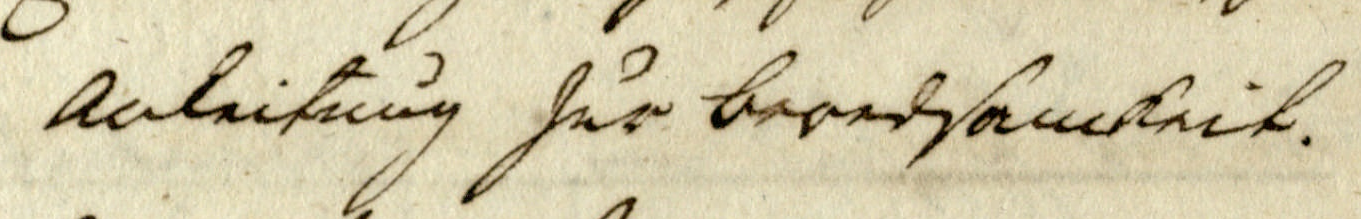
Anleitung für Beredsamkeit.
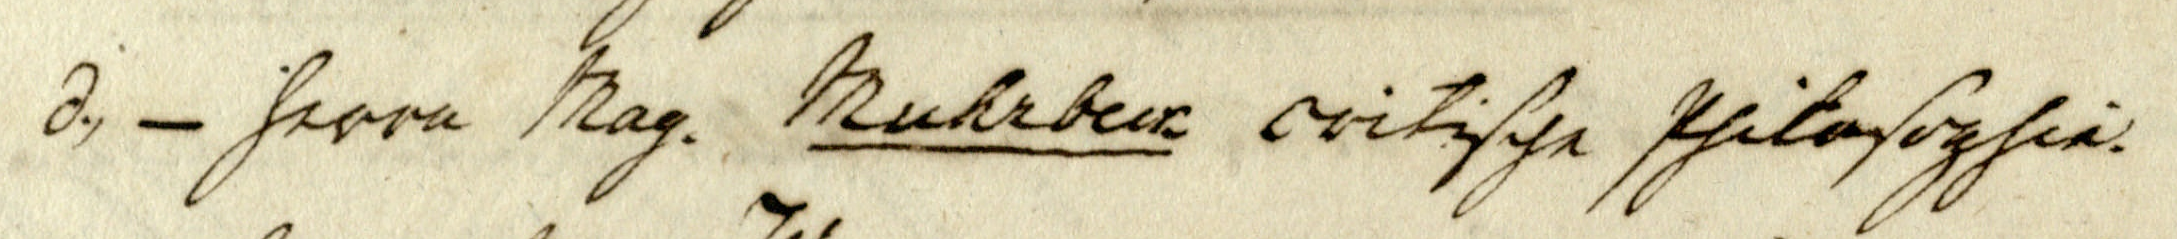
d, herrn Mag. Muhrbeck critische Philosophie
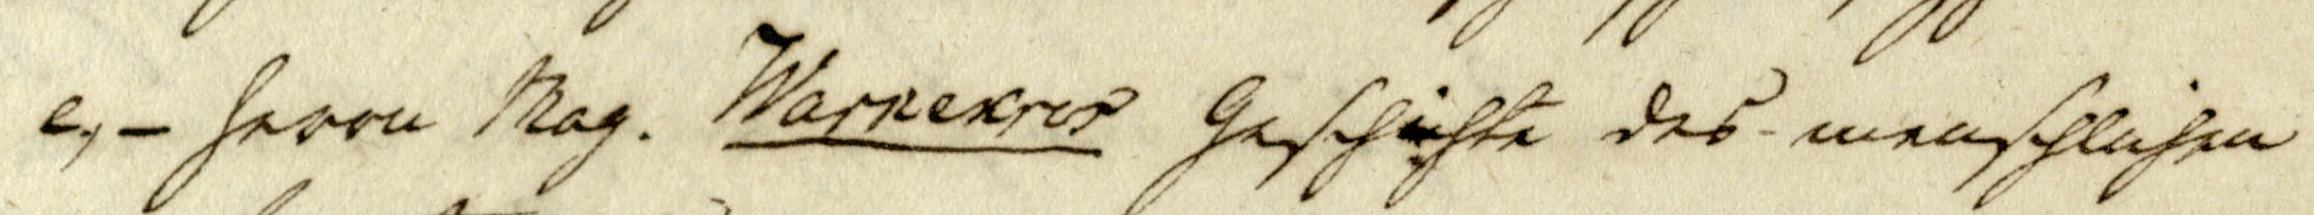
e, herrn Mag. Warnekros Geschichte des menschlichen
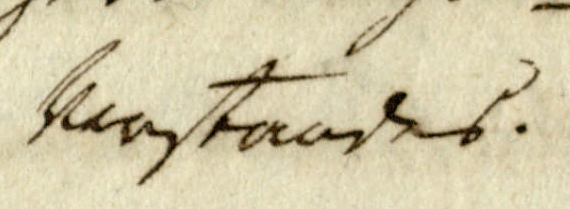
Verstandes.
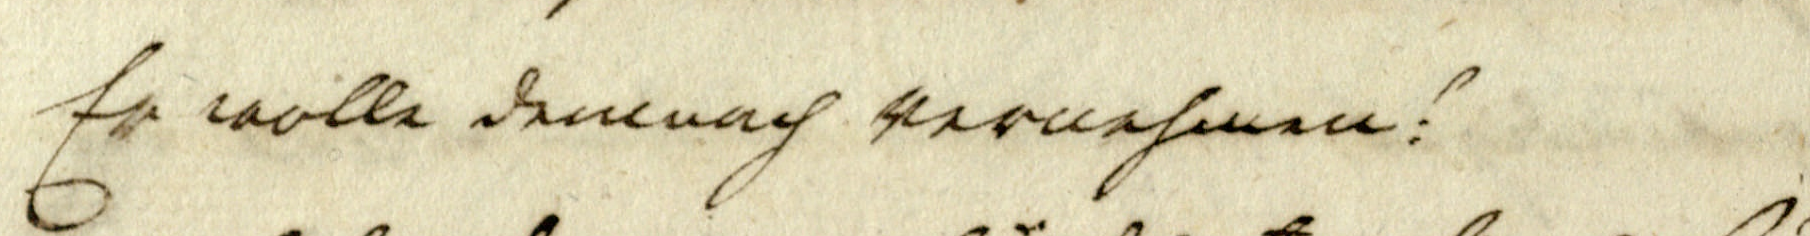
Er wolle demnach vernehmen:
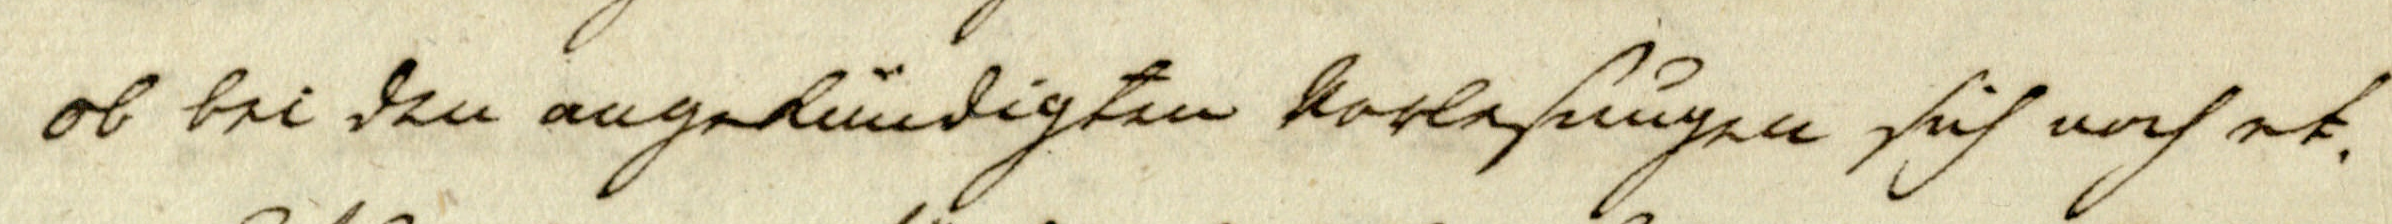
ob bei den angekündigten Vorlesungen sich noch et¬
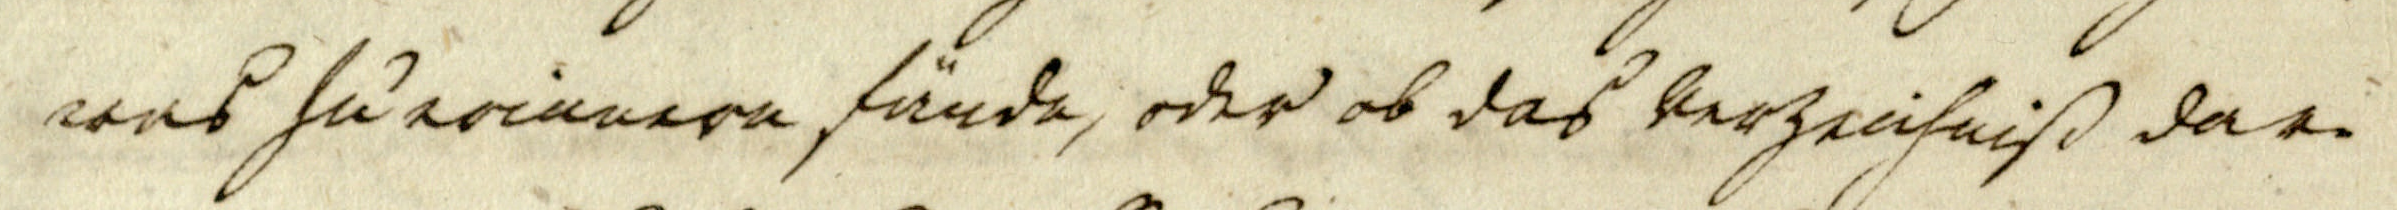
was zu erinnern fände, oder ob das Verzeichniß dar¬
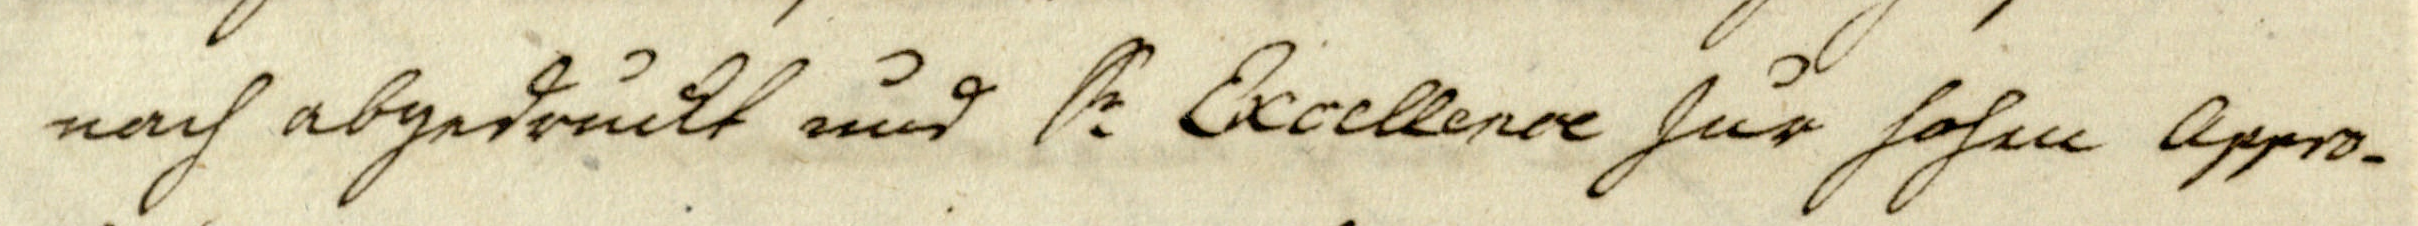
nach abgedruckt und Sr. Excellence zur hohen Appro¬
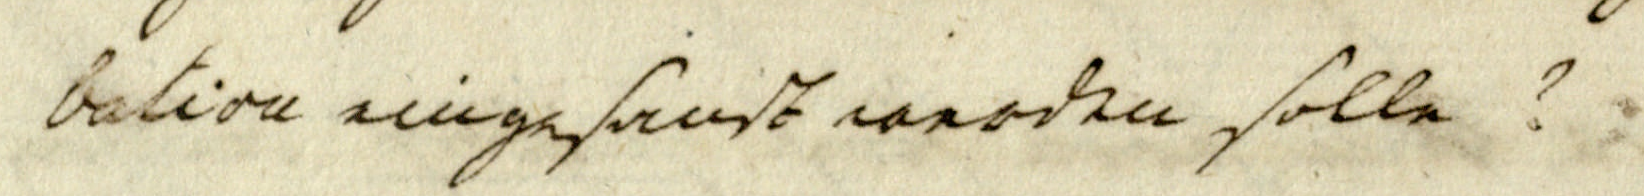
bation eingesandt werden solle?
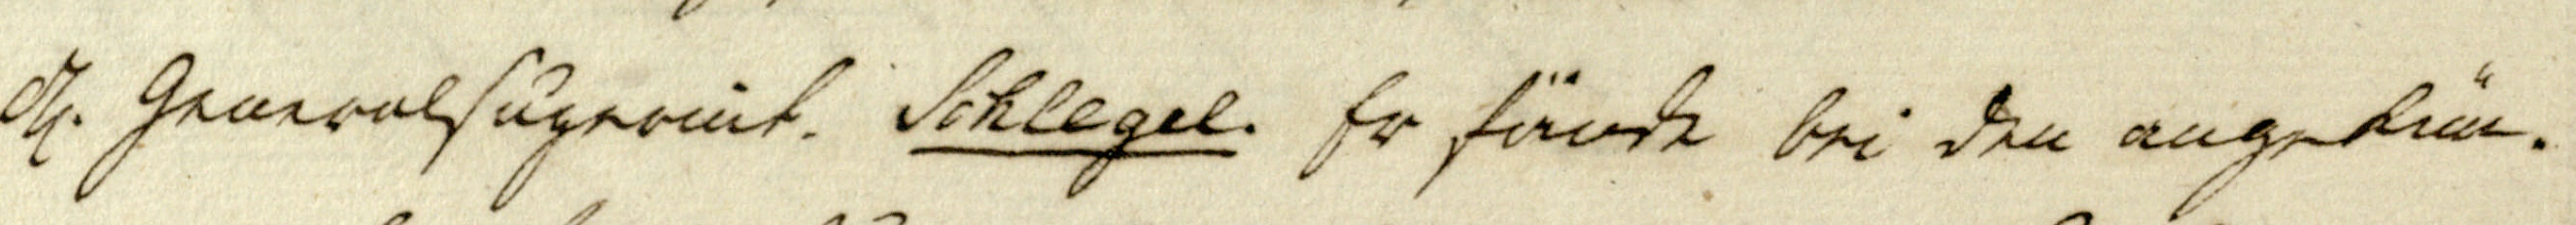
dh. Generalsuperint. Schlegel. Er fände bei den angekün¬
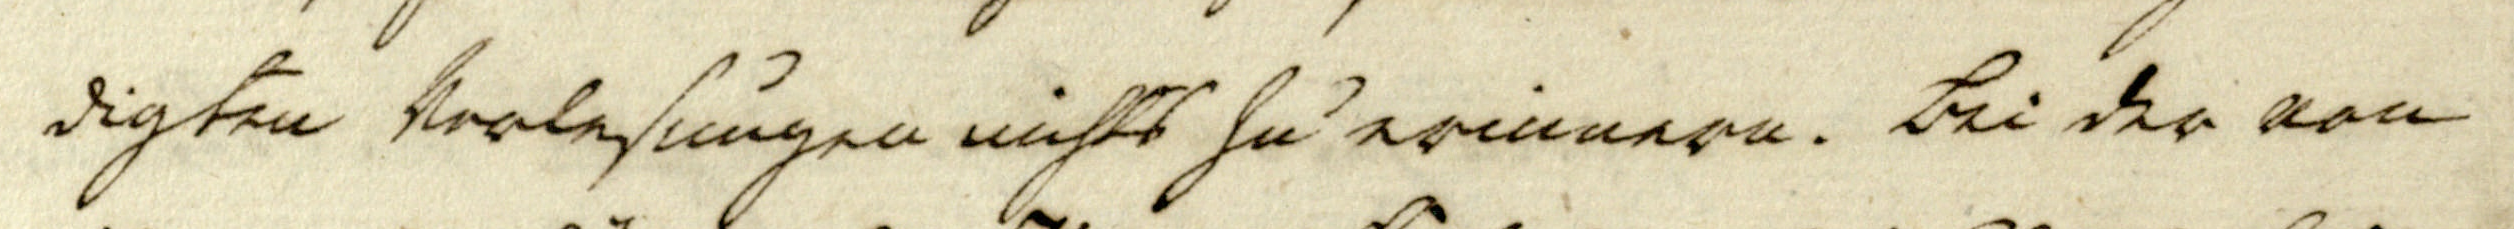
digten Vorlesungen nichts zu erinnern. Bei der von
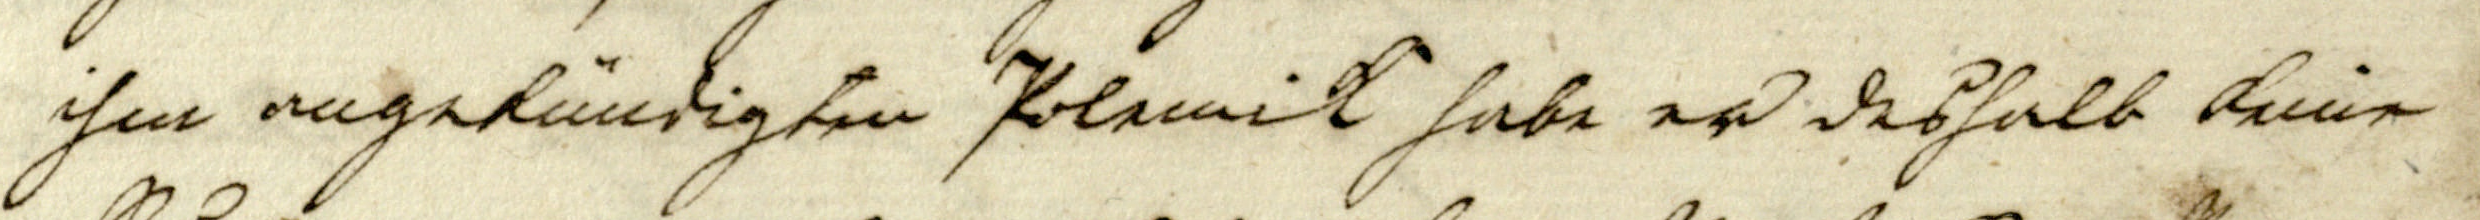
ihm angekündigten Polemik habe er deshalb keine
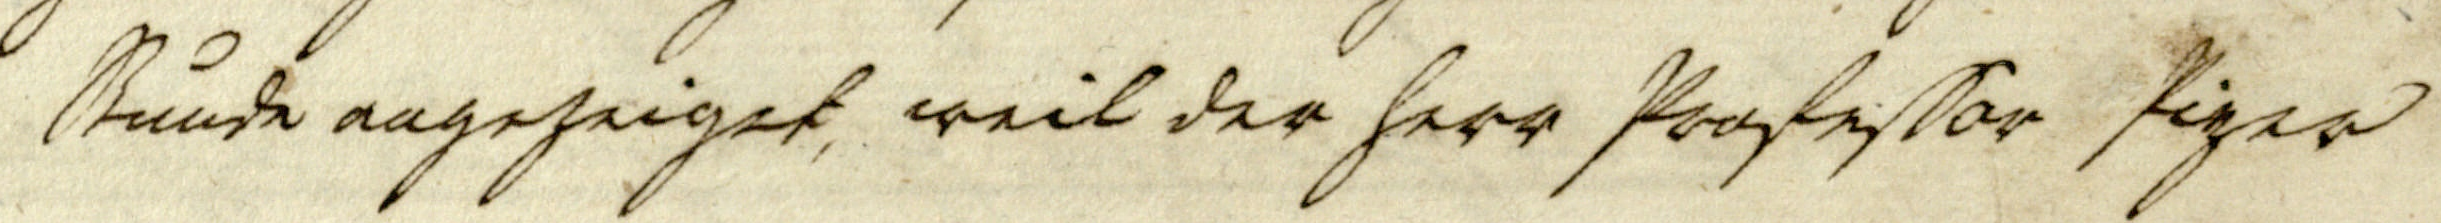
Stunde angezeiget, weil der herr Professor Piper
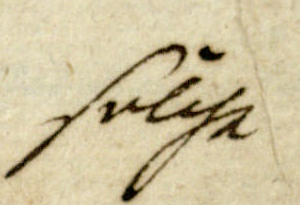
solche
